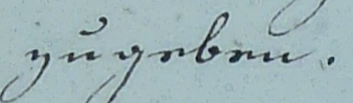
zugeben.
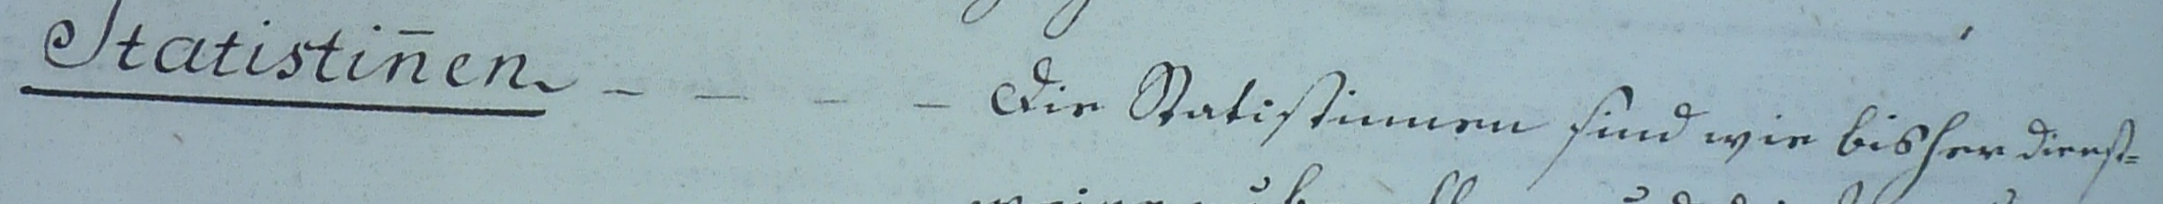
Statistin̅en _ _ _ _ Die Statistinnen sind wie bisher dienst¬
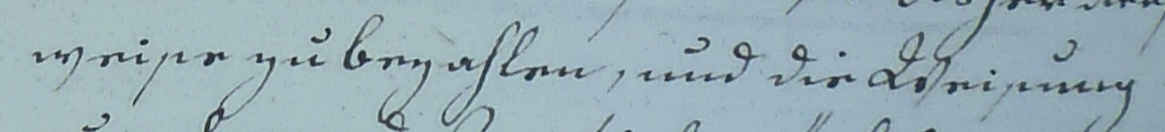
weise zubezahlen, und die Weisung
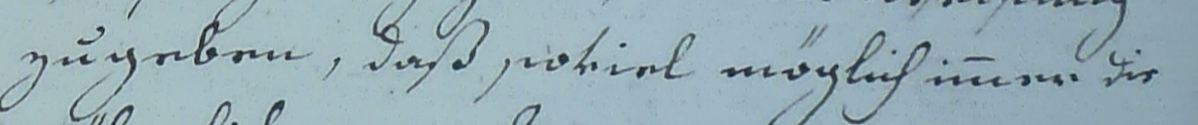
zugeben, daß soviel möglich im̅er die
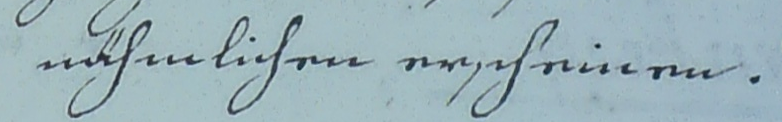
nähmlichen erscheinen.
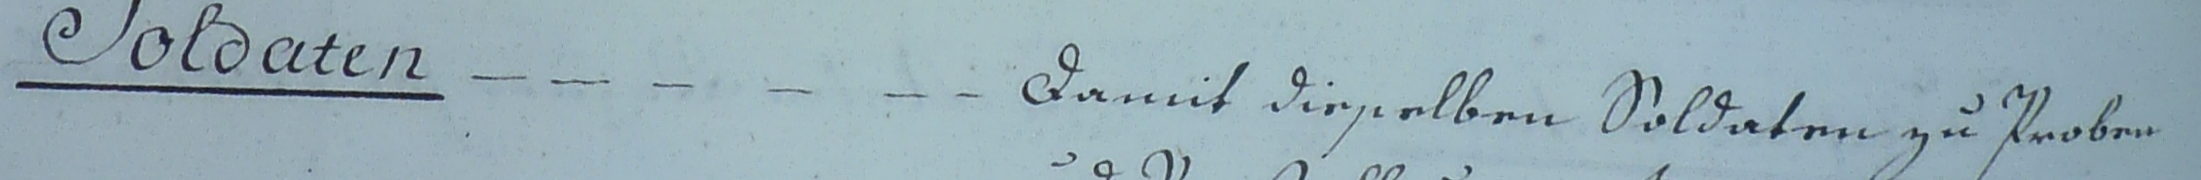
Soldaten _ _ _ _ _ _ Damit dieselben Soldaten zu Proben
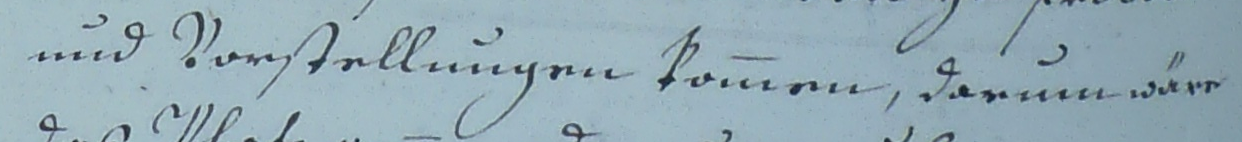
und Vorstellungen kom̅en, darum wäre
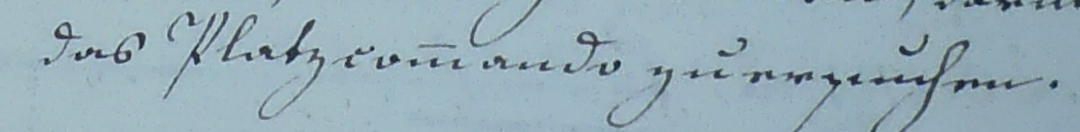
das Platzcom̅ando zuersuchen.
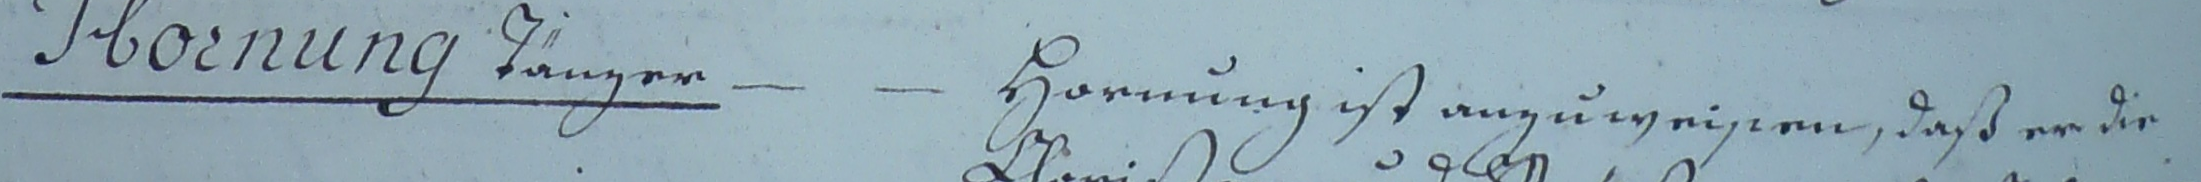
Hornung Tänzer _ _ Hornung ist anzuweisen, daß er die
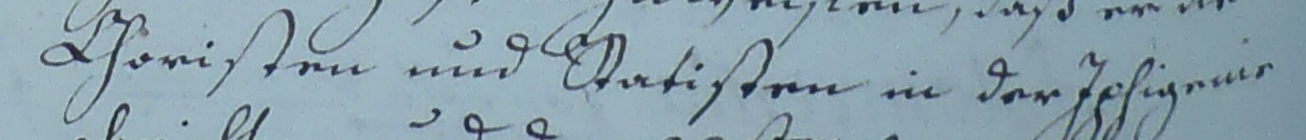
Choristen und Statisten in der Iphigenie
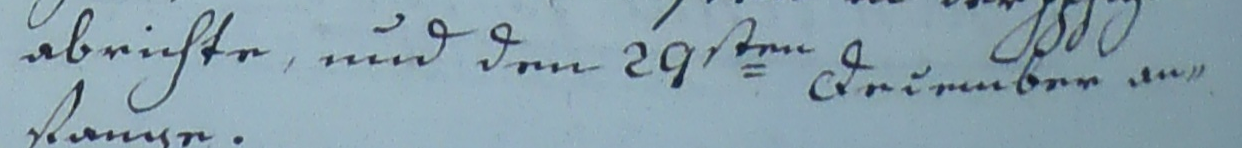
abrichte, und den 29ste͇n December an¬
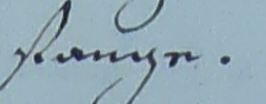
fange.
